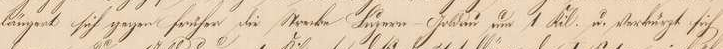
längert sich gegen früher die Strecke Luzern–Goldau um 1 Kil. u. verkürzt sich
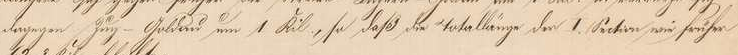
dagegen Zug–Goldau um 1 Kil., so daß die Totallänge der I. Section wie früher
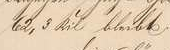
62,3 Kil bleibt.
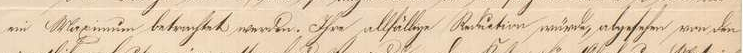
ein Maximum betrachtet werden. Ihre allfällige Reduction würde, abgesehen von den
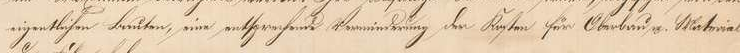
eigentlichen Bauten, eine entsprechende Verminderung der Kosten für Oberbau &. Material
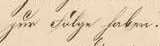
zur Folge haben.
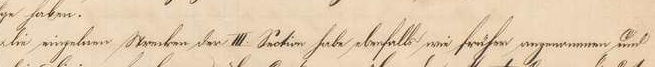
Die einzelnen Strecken der III. Section habe ebenfalls wie früher angenommen und
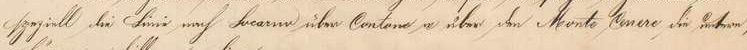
speziell die Linie nach Locarno über Contone & über den Monte Cenere die untere,
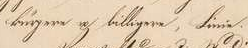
kürzere & billigere, Linie.
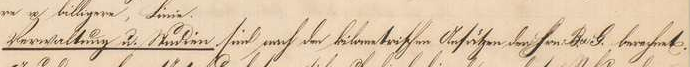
Verwaltung u. Studien sind nach den kilometrischen Ansätzen der Hrn. B. & G. berechnet.
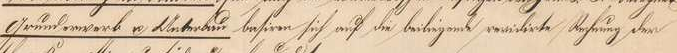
Grunderwerb & Unterbau basiren sich auf die beiligende revidirte Rechnung der
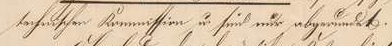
technischen Kommission u. sind nur abgerundet.
